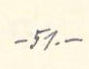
51
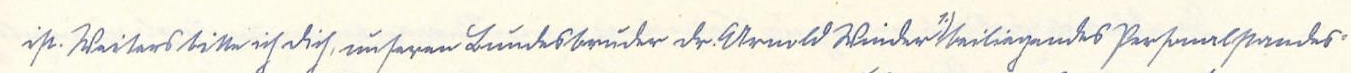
ist. Weiters bitte ich dich, unserem Bundesbruder Dr. Arnold Winder beiliegendes Personalstandes
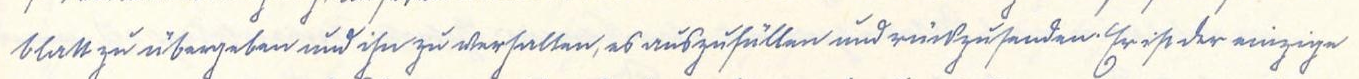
blatt zu übergeben und ihn zu verhalten, es auszufüllen und zurückzusenden. Er ist der einzige
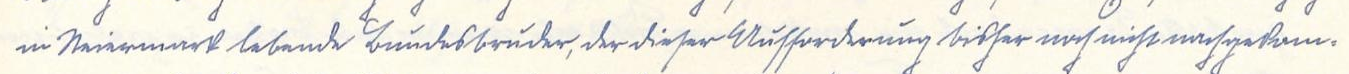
in Steiermark lebenden Bundesbruder, der dieser Aufforderung bisher noch nicht nachgekom-
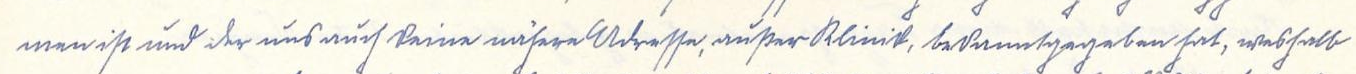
men ist und der uns auch keine nähere Adresse, außer Klinik, bekannt gegeben hat, weshalb
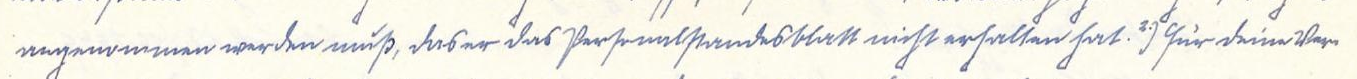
angenommen werden muß, dass er das Personalstandesblatt nicht erhalten hat. 1) Für deine Ver
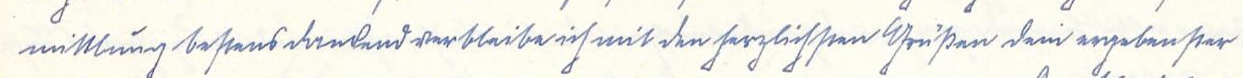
mittlung bestens dankend verbleibe ich mit den herzlichsten Grüßen dein ergebenster
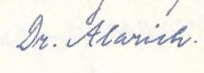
Dr. Alarich
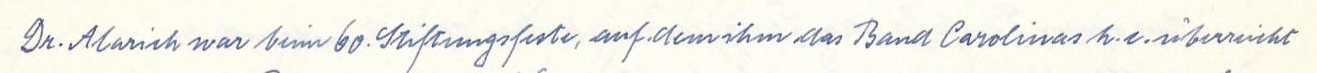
Dr. Alarich war beim 60. Stiftungsfeste, auf dem ihm das Band der Carolina h. c. überreicht
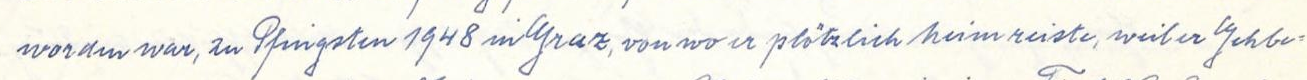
worden war, zu Pfingsten 1948 in Graz, von wo er plötzlich heim reiste, weil er Gehbe-
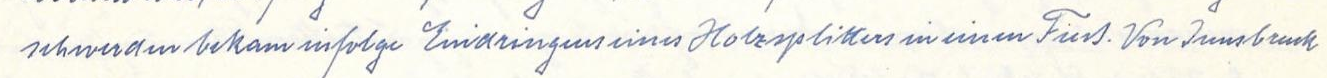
schwerden bekam infolge Eindringens eines Holzsplitters in einen Fuß. Von Innsbruck
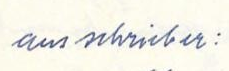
aus schrieb er:
